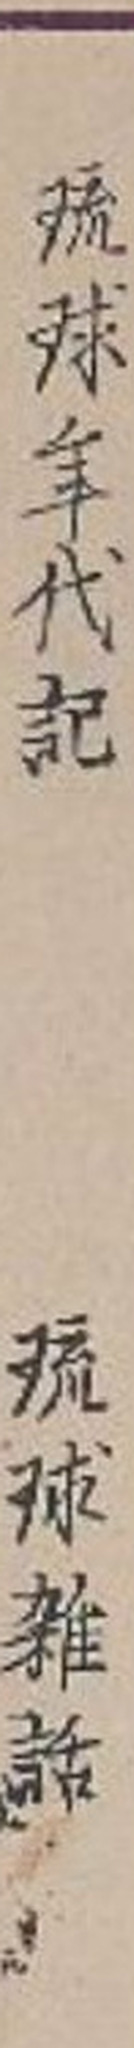琉球年代記琉球雑話

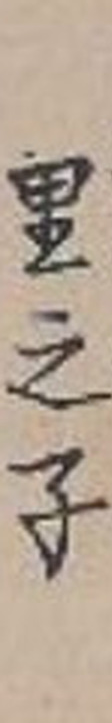里之子
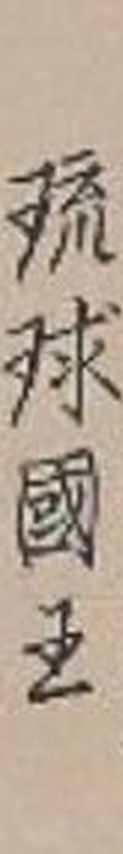琉球国王

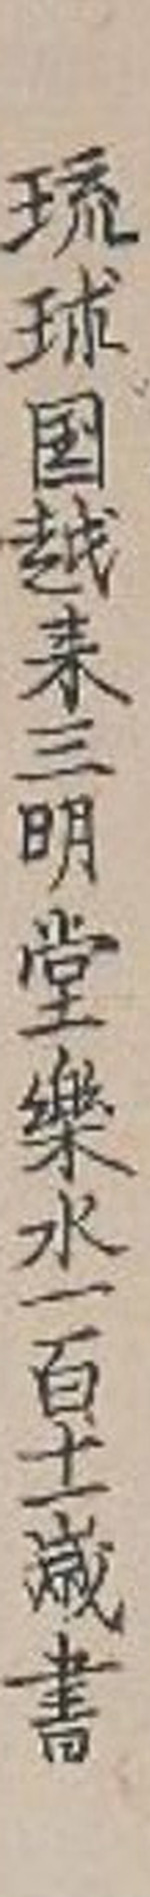琉球国越来三明堂楽水一百十一歳書
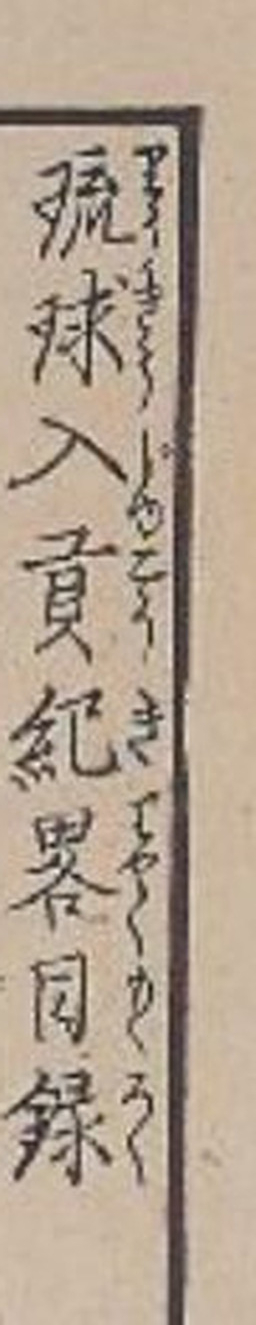琉球入貢紀略目録
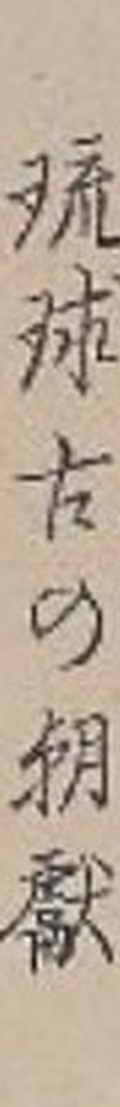琉球古の朝献
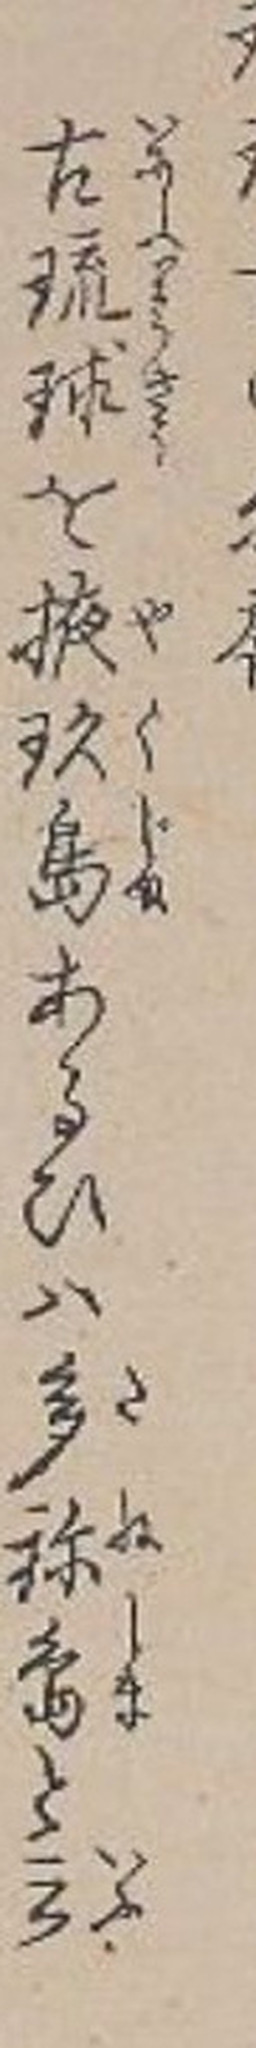古琉球を掖玖島あるひは多祢島と云
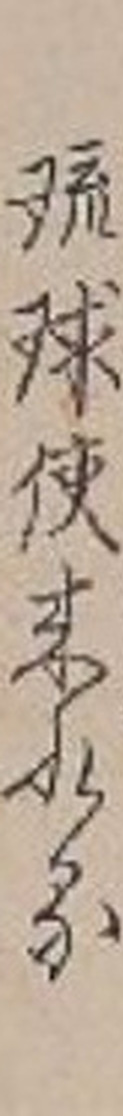琉球使来れる
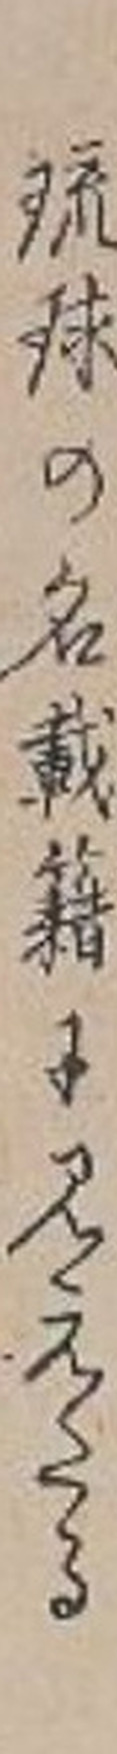琉球の名載籍に見えたる
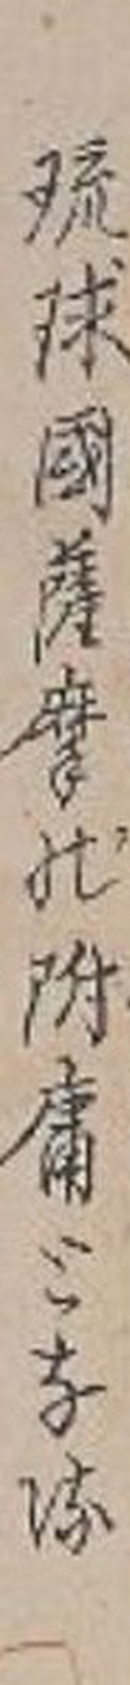琉球国薩摩の附庸となる
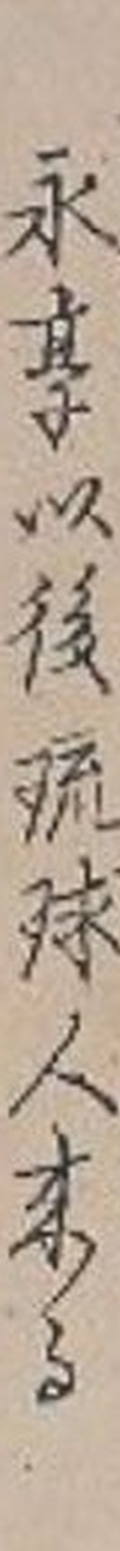永享以後琉球人来る
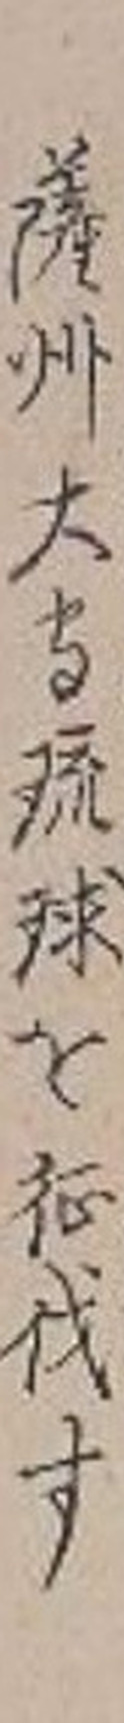薩洲大守琉球を征伐す
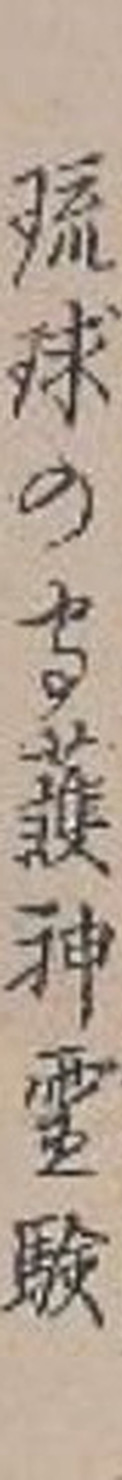琉球の守護神霊験

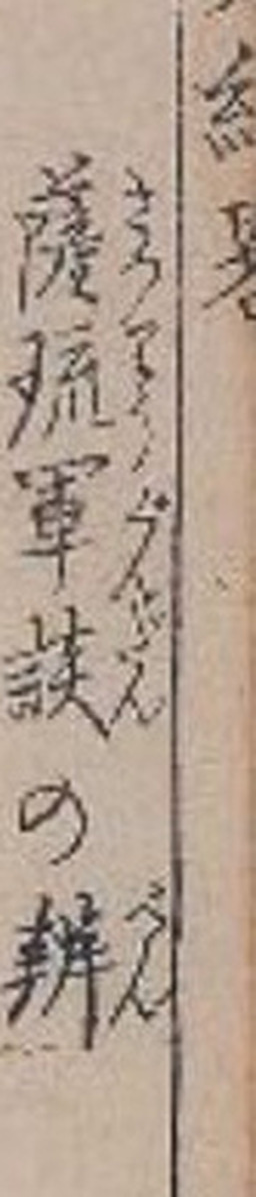薩琉軍談の弁
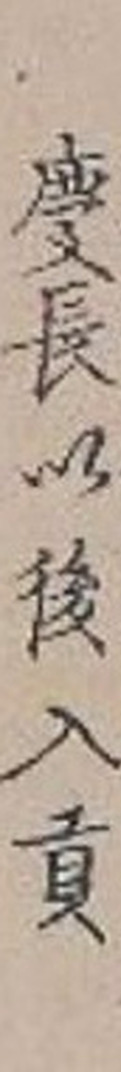慶長以後入貢
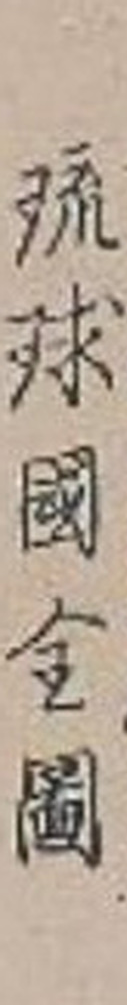琉球国全図
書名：琉球入貢紀略
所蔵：University of the Ryukyus Library
